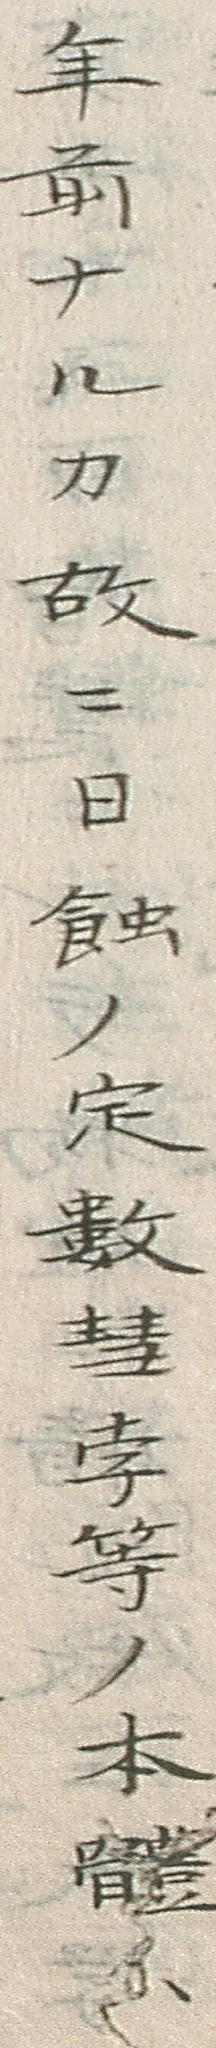年前ナルカ故ニ日蝕ノ定数彗孛等ノ本体ハ
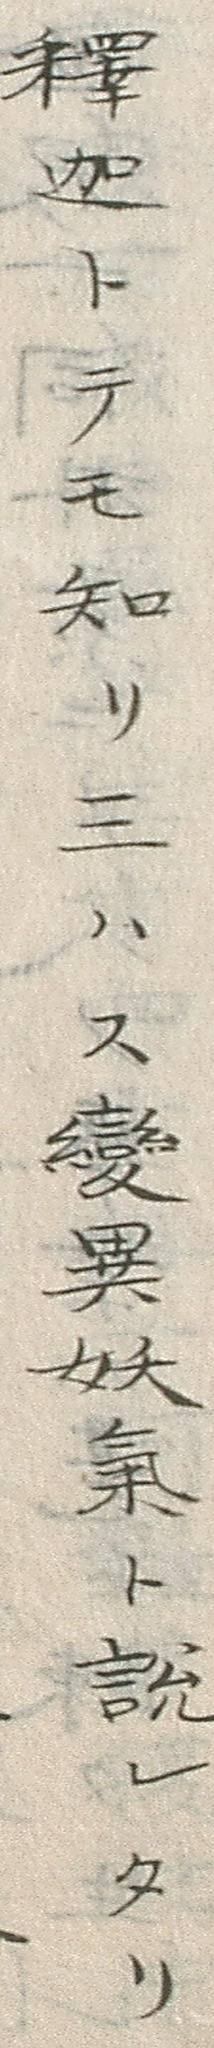釈迦トテモ知リ三ハス変異妖気ト説レタリ
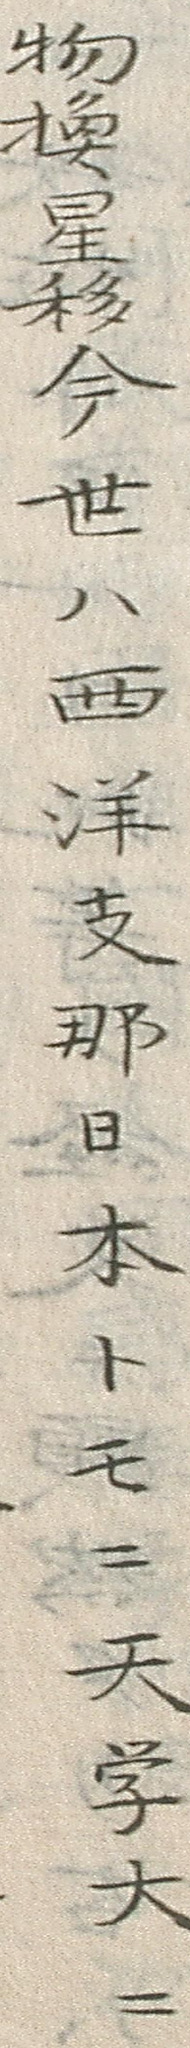物換星移今世ハ西洋支那日本トモニ天学大ニ
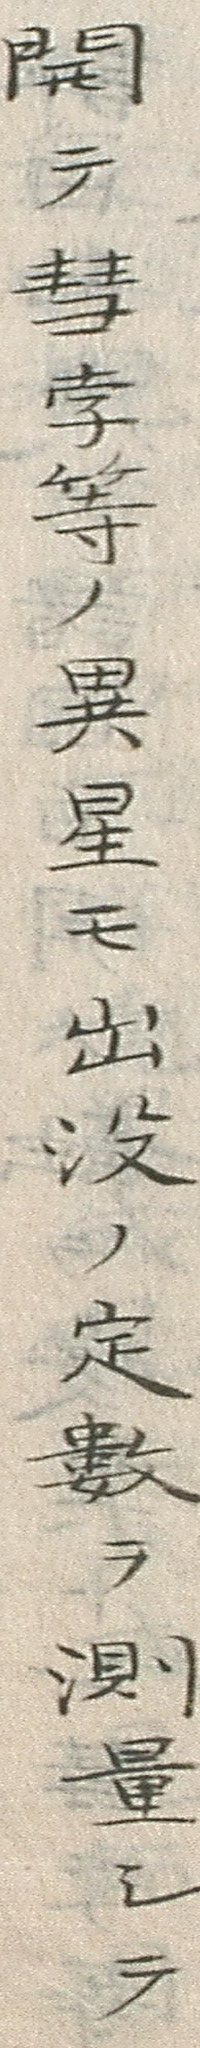開テ彗孛等ノ異星モ出没ノ定数ヲ測量シテ
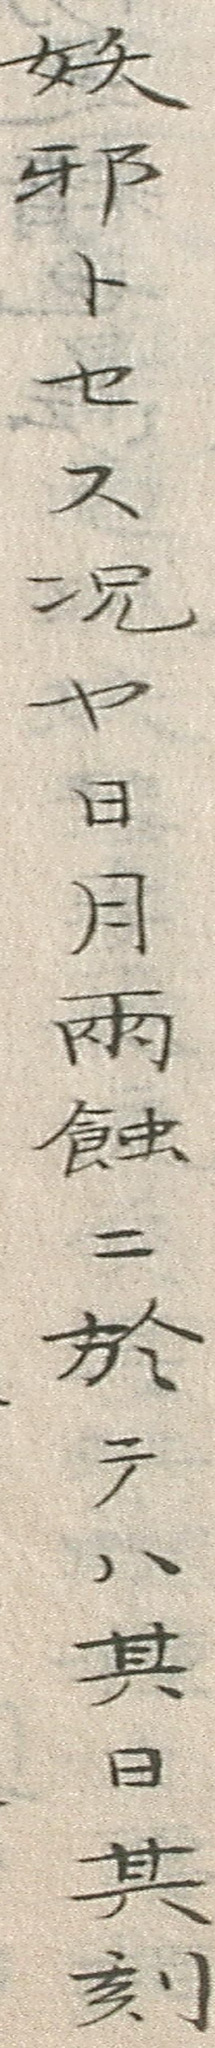妖邪トセス況ヤ日月両蝕ニ於テハ其日其刻
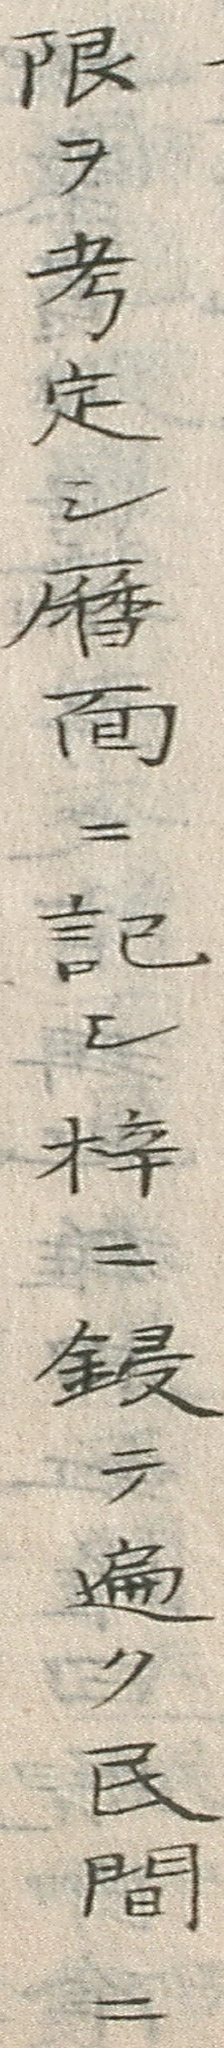限ヲ考定シ暦面ニ記シ梓ニ鋟テ遍ク民間ニ
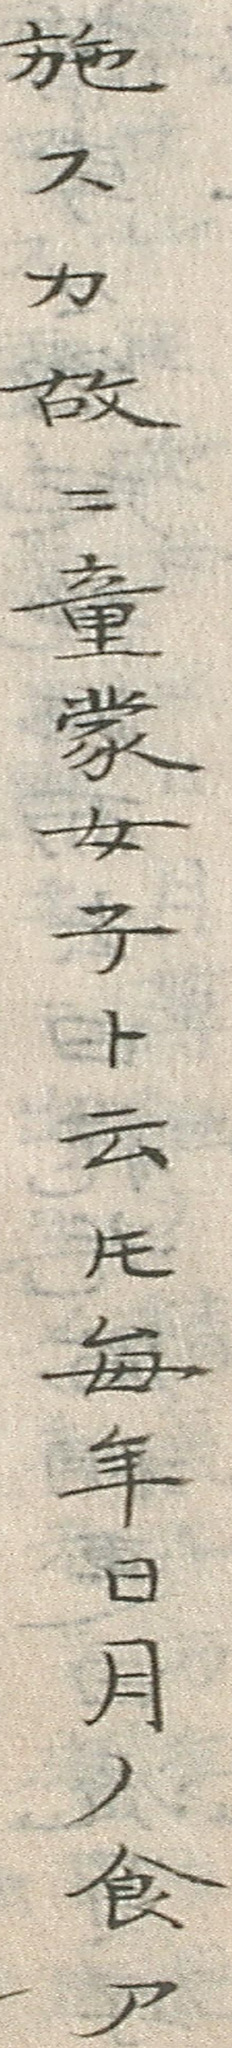施スカ故ニ童蒙女子ト云トモ毎年日月ノ食ア
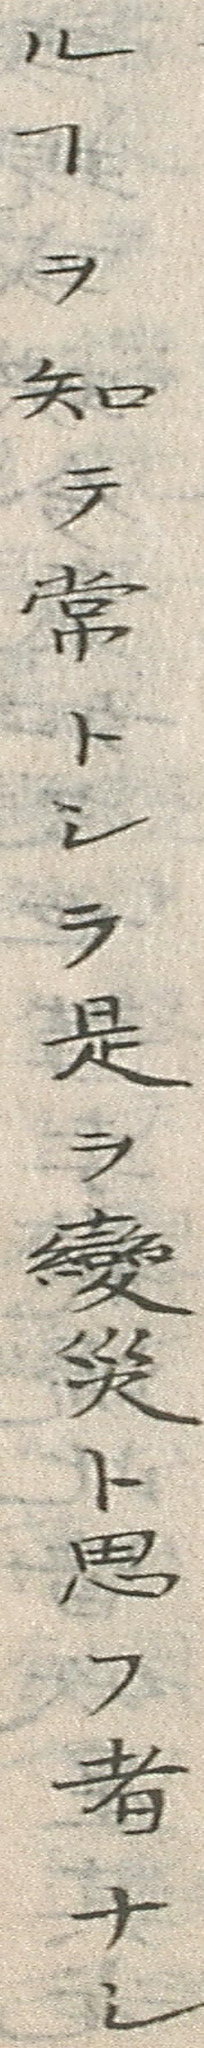ルコトヲ知テ常トシテ是ヲ変災ト思フ者ナシ
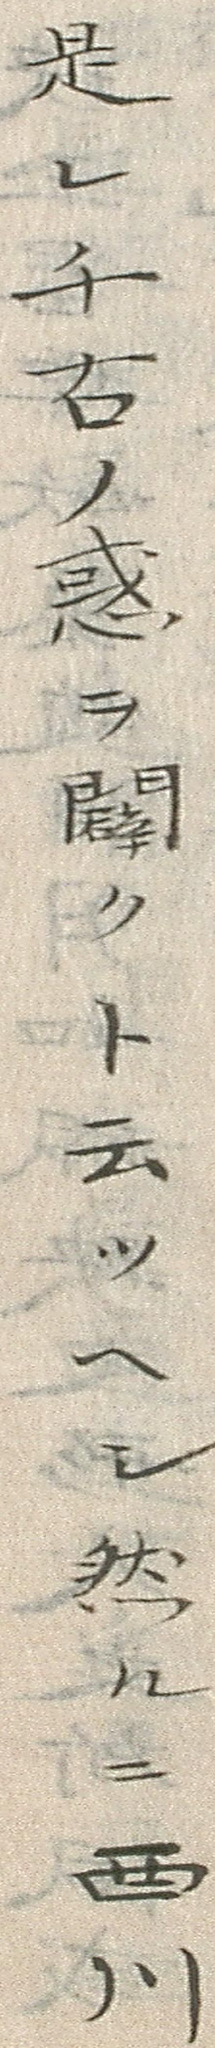是レ千古ノ惑ヲ闢クト云ッヘシ然ルニ西川
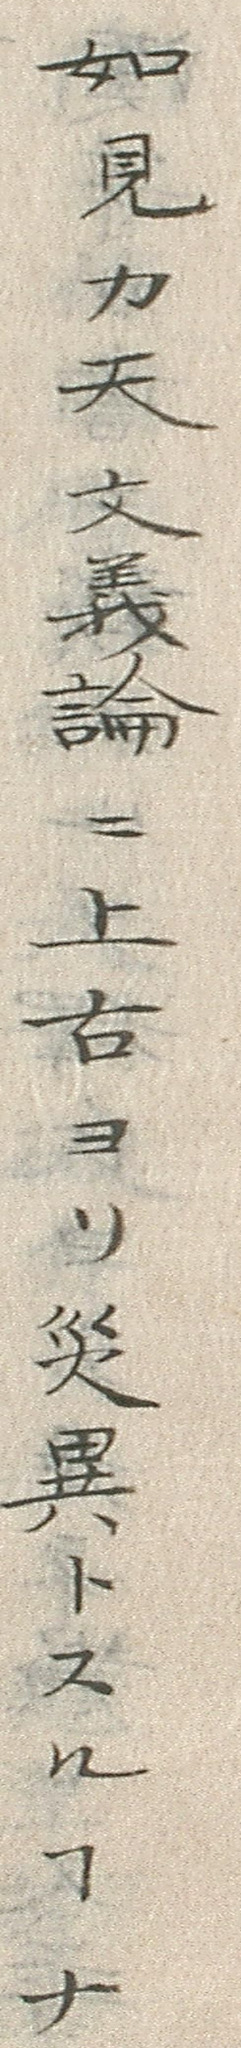如見カ天文義論ニ上古ヨリ災異トスルコトナ
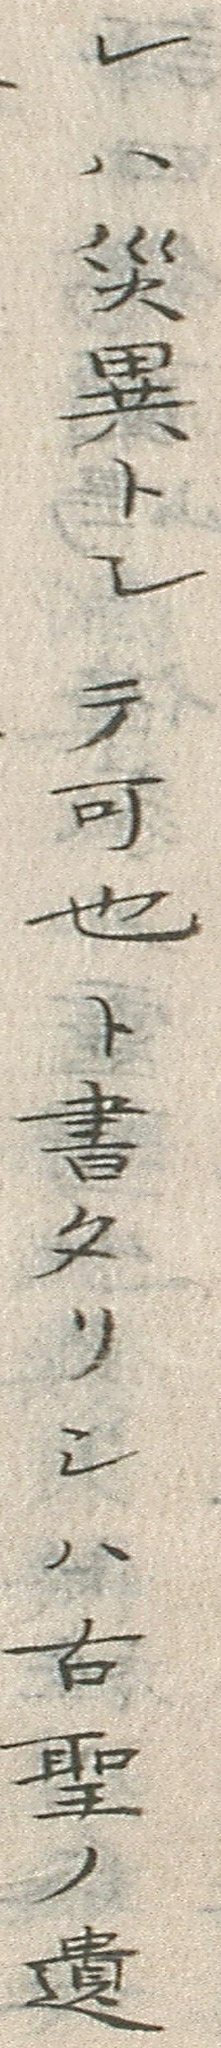レハ災異トシテ可也ト書タリシハ古聖ノ遺
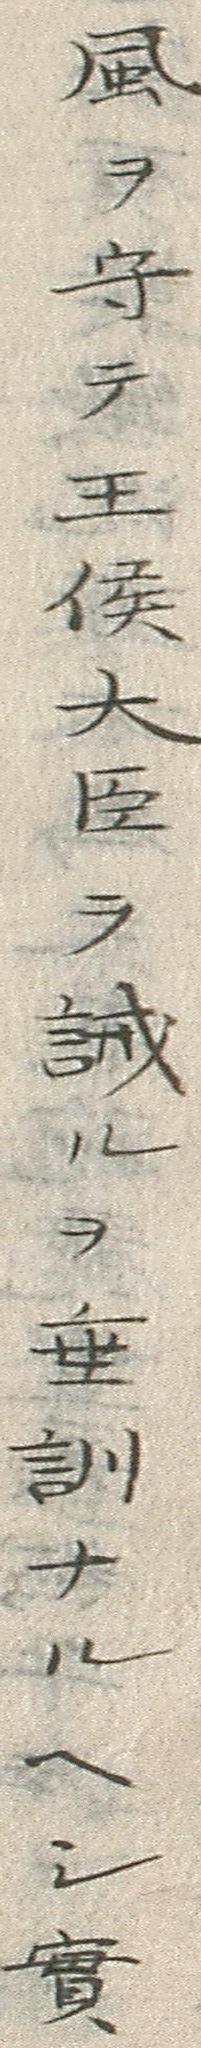風ヲ守テ王侯大臣ヲ誡ルヲ垂訓ナルヘシ実
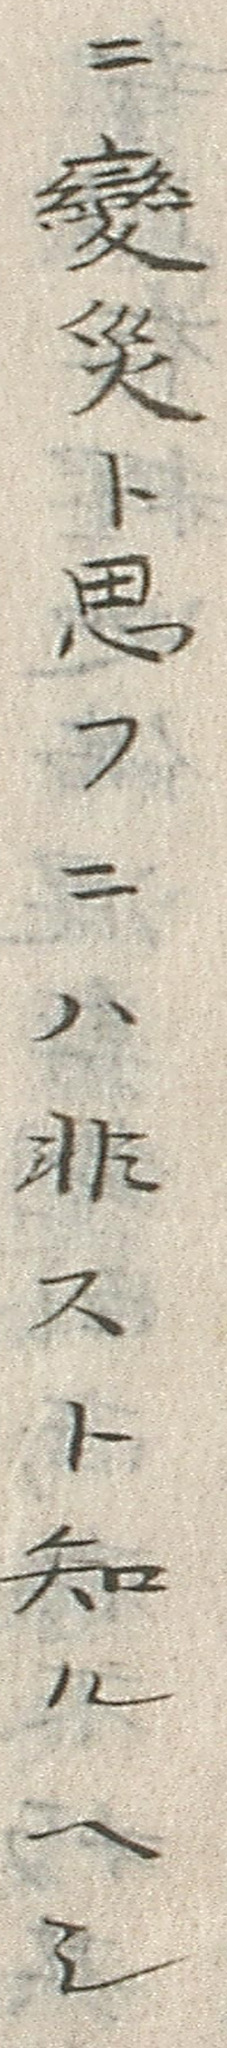ニ変災ト思フニハ非スト知ルヘシ
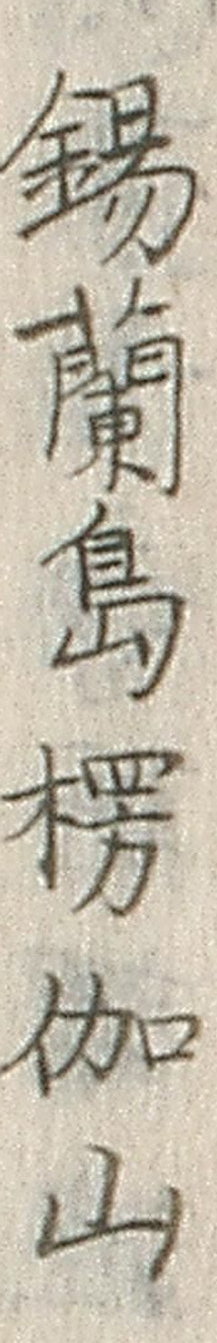錫蘭島楞伽山
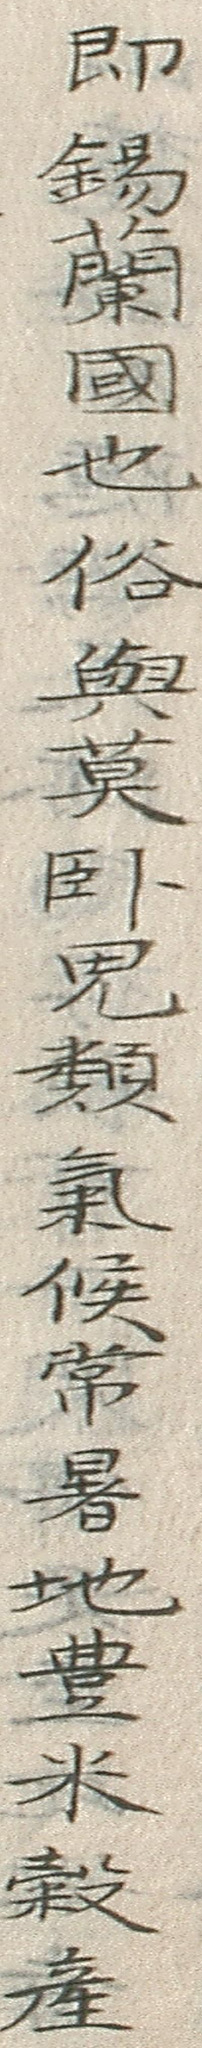即錫蘭国也俗与莫臥児類気候常暑地豊米穀産
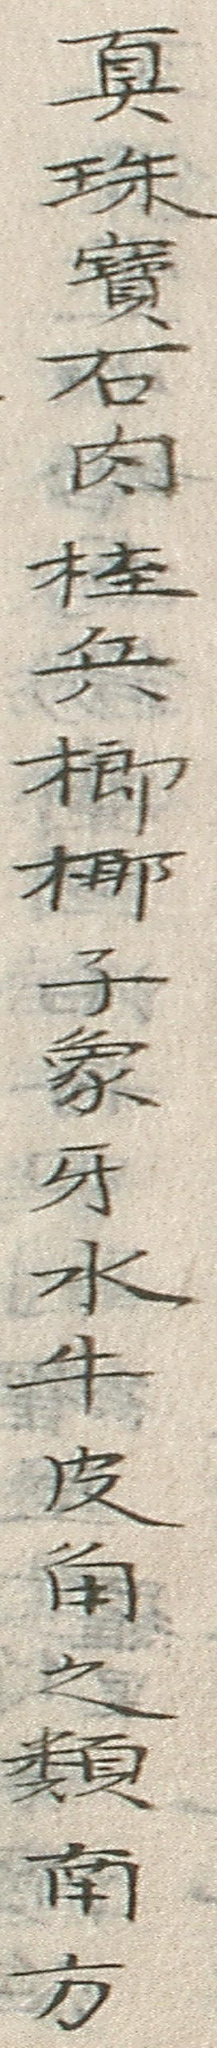真珠宝石肉桂兵榔椰子象牙水牛皮角之類南方
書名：天學略名目羽翼　全
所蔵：東京大学地震研究所図書室 Earthquake Research Institute Library, The University of Tokyo, JAPAN
